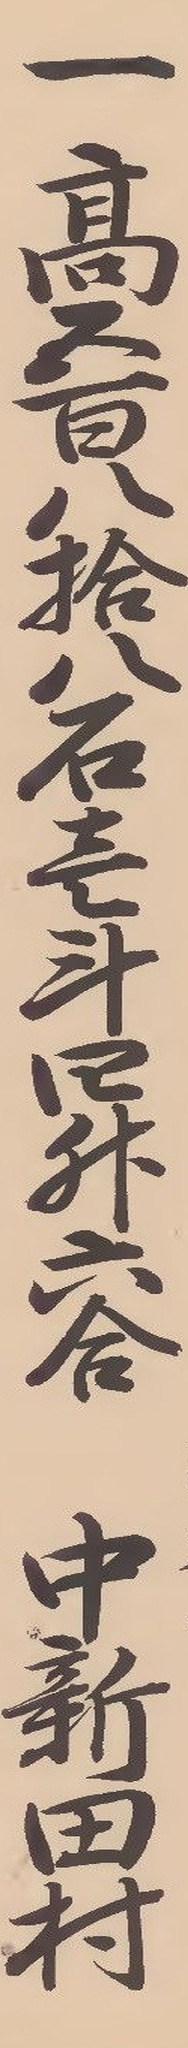一高五百八拾八石壱斗四升六合中新田村
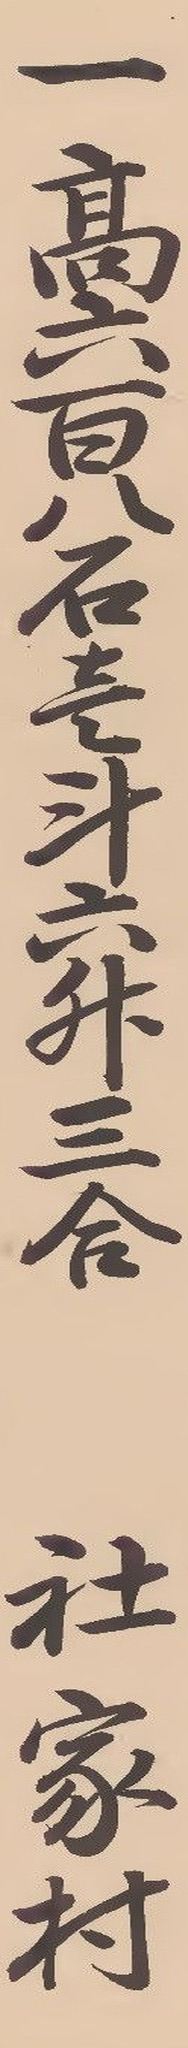一高六百八石壱斗六升三合社家村
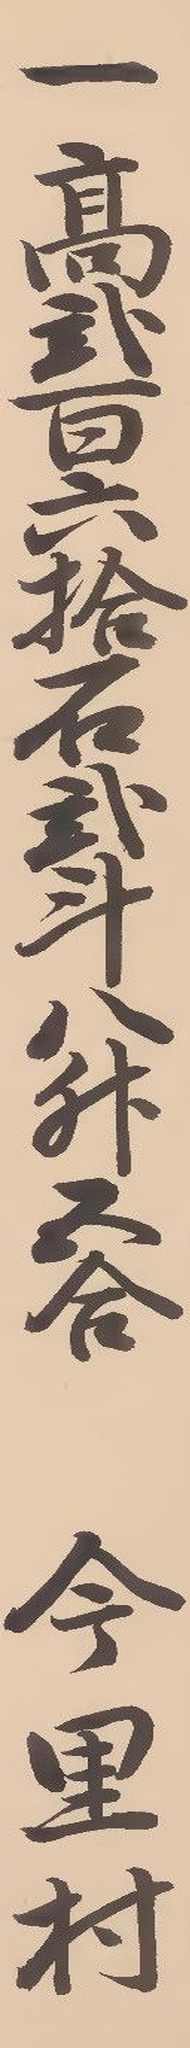一高弐百六拾石弐斗八升五合今里村
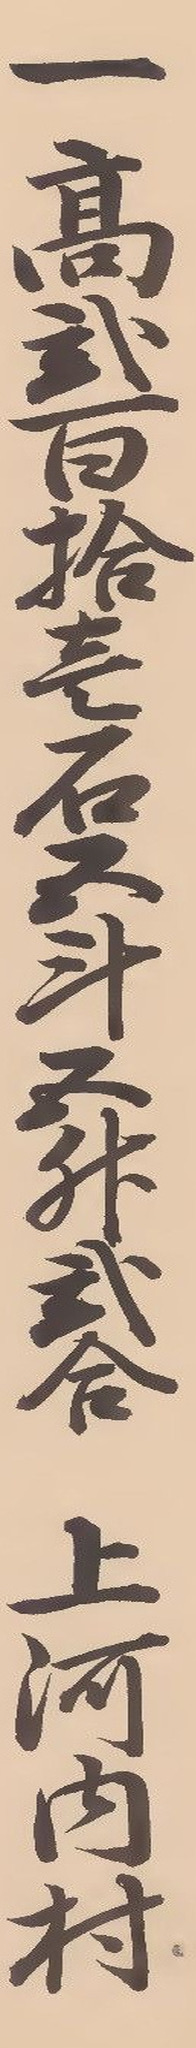一高弐百拾壱石五斗五升弐合上河内村
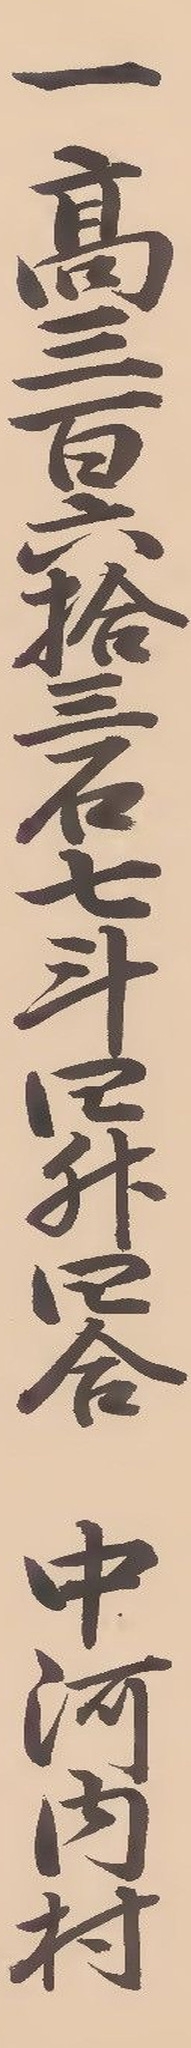一高三百六拾三石七斗四升四合中河内村
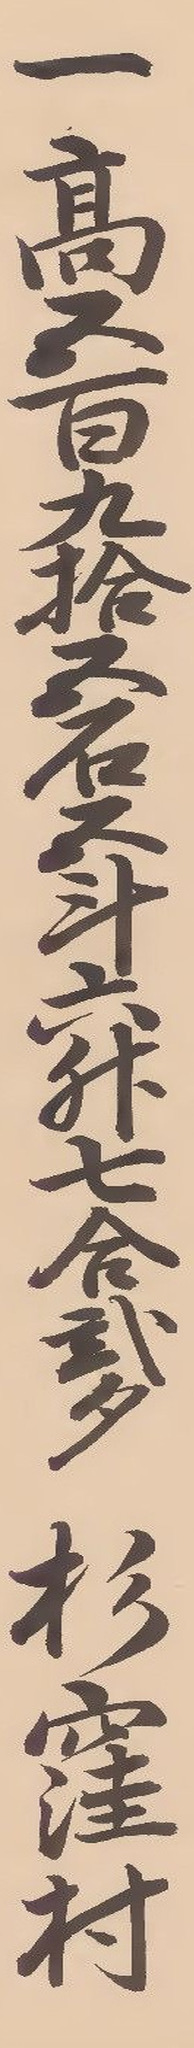一高五百九拾五石五斗六升七合弐勺杉窪村

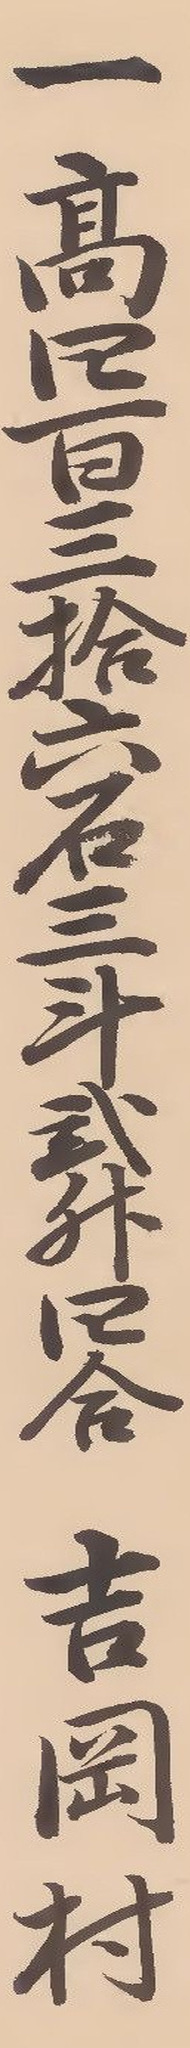一高四百三拾六石三斗弐升四合吉岡村
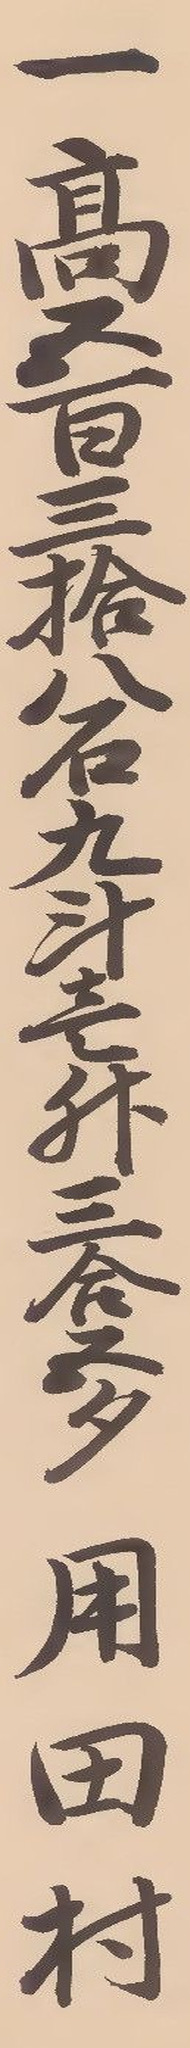一高五百三拾八石九斗壱升三合五勺用田村
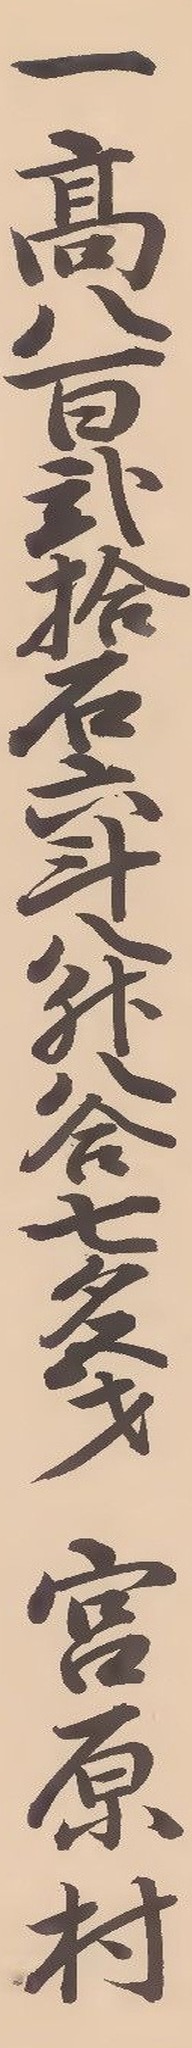一高八百弐拾石六斗八升八合七勺五才宮原村
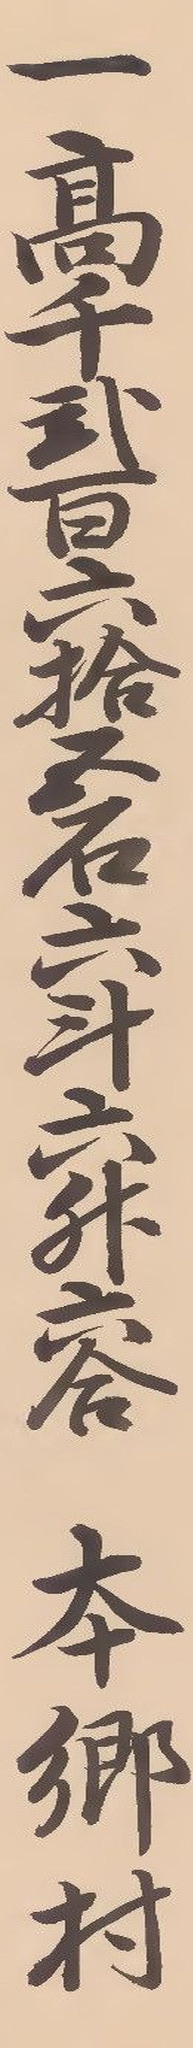一高千弐百六拾五石六斗六升六合本郷村
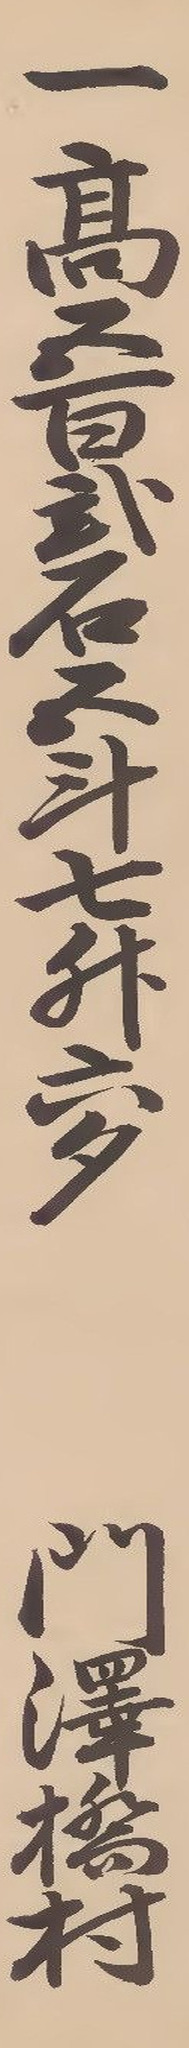一高五百弐石五斗七升六勺門澤橋村
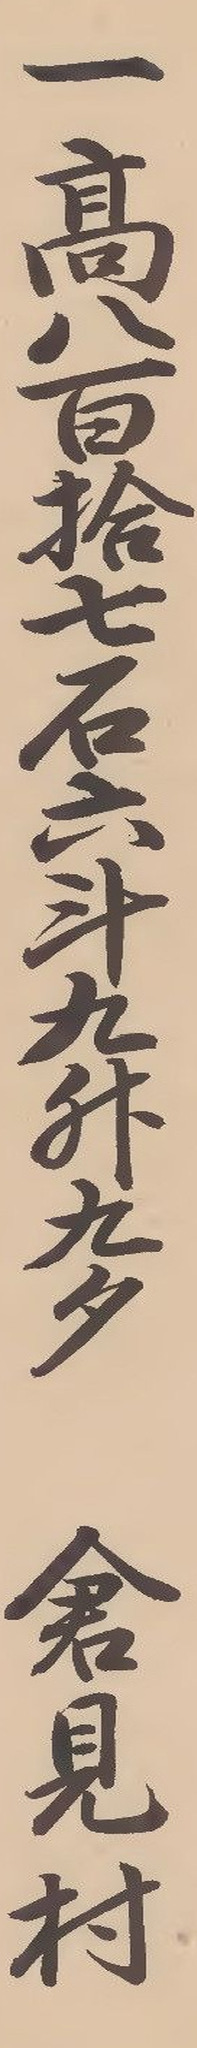一高八百拾七石六斗九升九勺倉見村
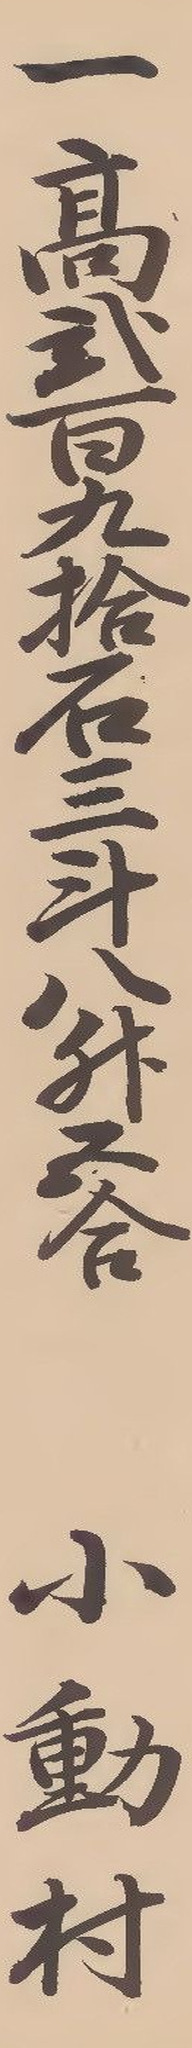一高弐百九拾石三斗八升五合小動村
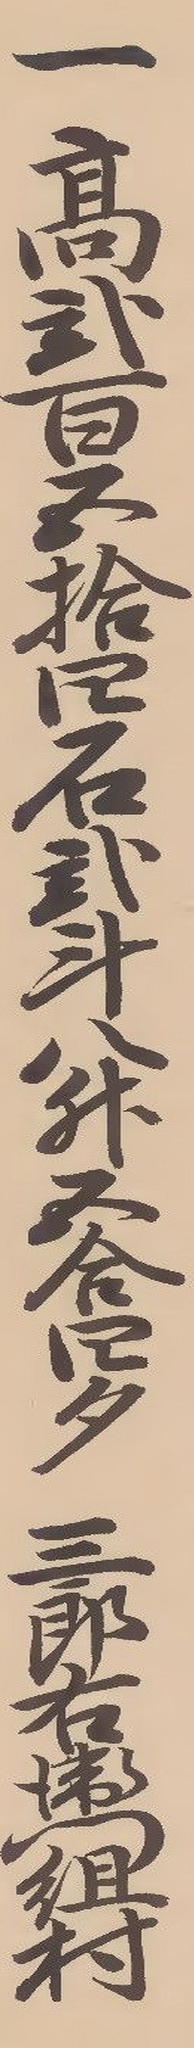一高弐百五拾四石弐斗八升五合四勺三郎右衛門組村

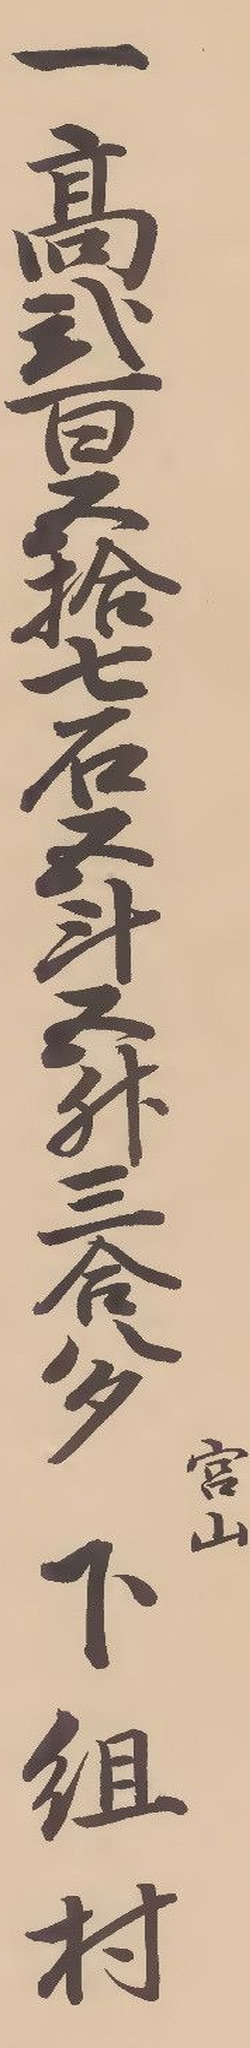一高弐百五拾七石五斗五升三合八勺下組村
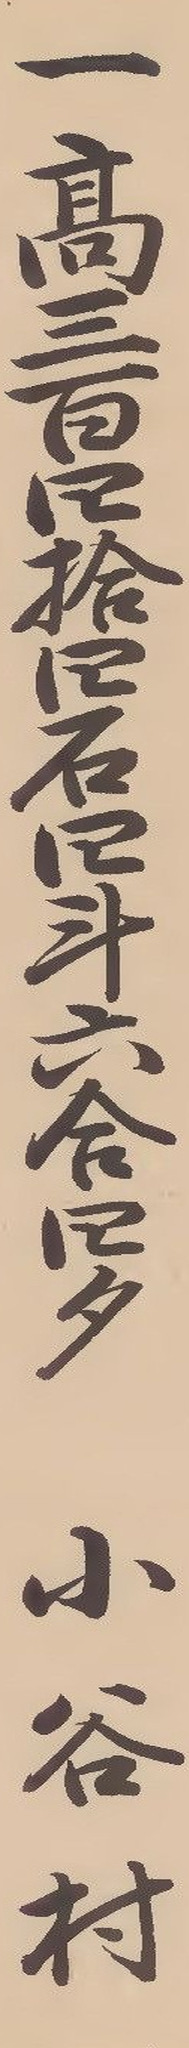一高三百四拾四石四斗六合四勺小谷村
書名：相模国郷帳
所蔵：国立公文書館 National Archives of Japan
